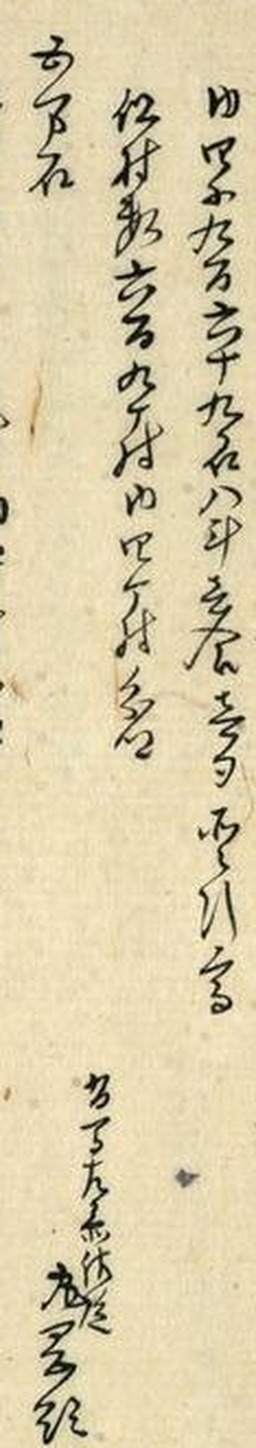但村数六百九ケ村内四ケ村分郷
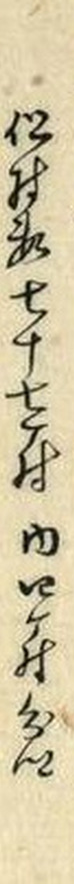但村数七十七ケ村内四ケ村分郷
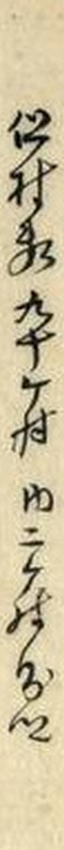但村数九十ケ村内二ケ村分郷

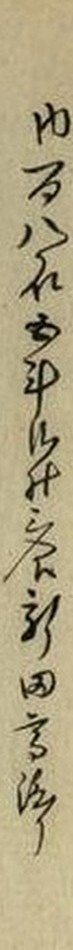内百八石五斗弐升三合新田高渡り
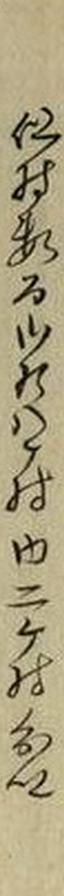但村数百弐拾八ケ村内二ケ村分郷
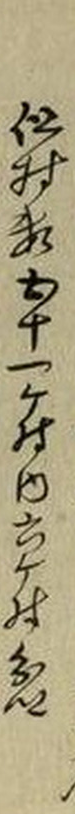但村数五十一ケ村内六ケ村分郷
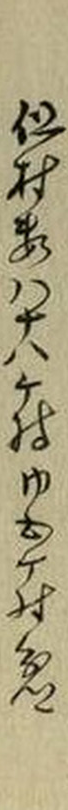但村数八十八ケ村内五ケ村分郷
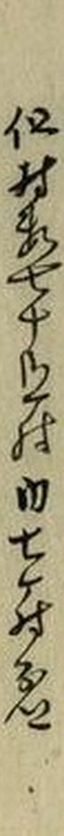但村数七十弐ケ村内七ケ村分郷
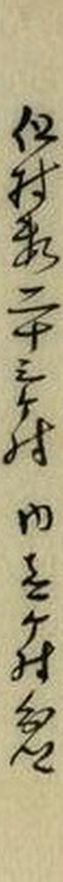但村数二十三ケ村内壱ケ村分郷
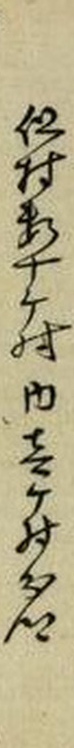但村数十ケ村内壱ケ村分郷
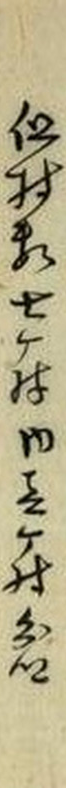但村数七ケ村内壱ケ村分郷
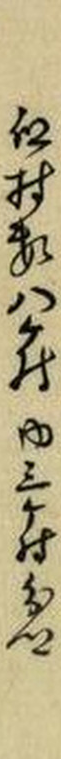但村数八ケ村内三ケ村分郷
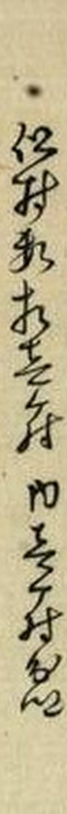但村数拾壱ケ村内壱ケ村分郷
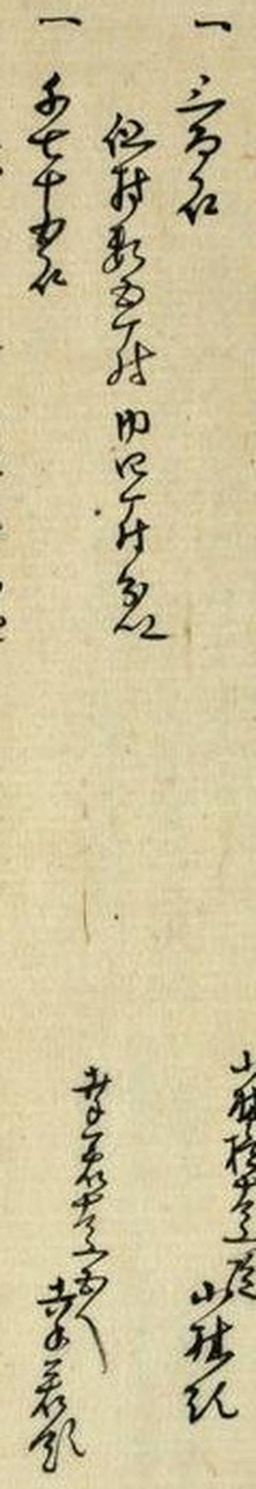但村数五ケ村内四ケ村分郷
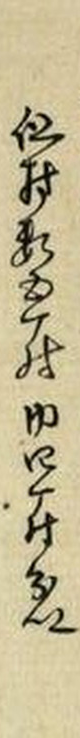但村数五ケ村内四ケ村分郷
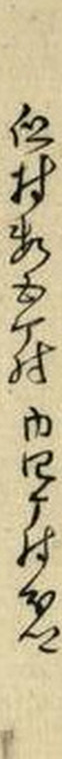但村数五ケ村内四ケ村分郷
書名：御国他国諸事之部
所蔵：福井県文書館 Fukui Prefectural Archives
